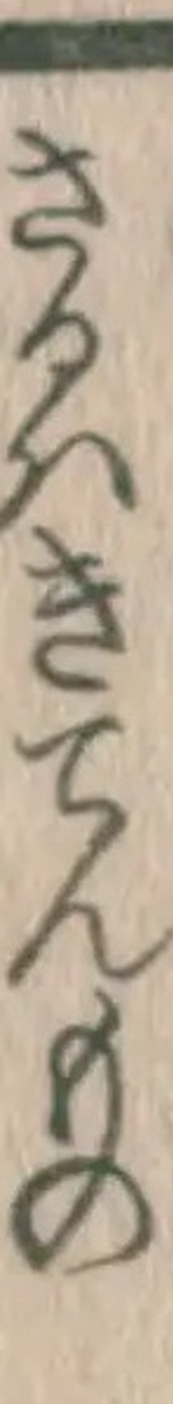さるはきてんもの
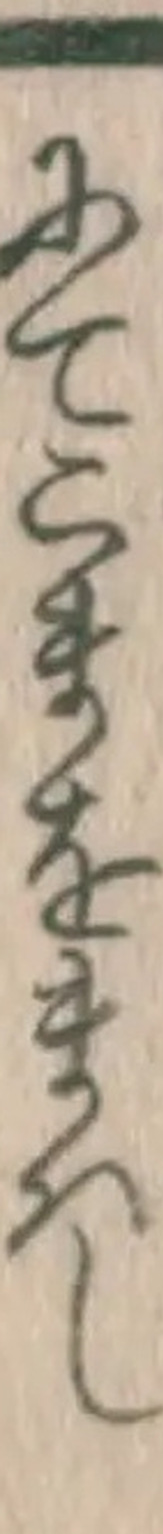にてこまをまはし
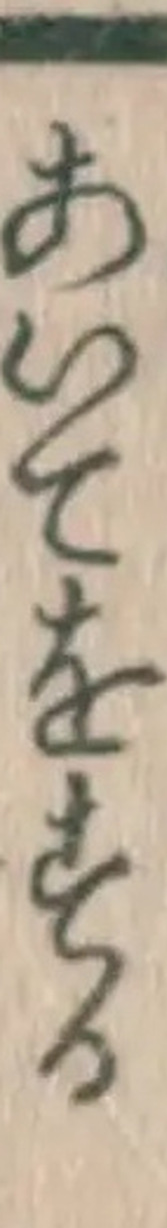あいてをする
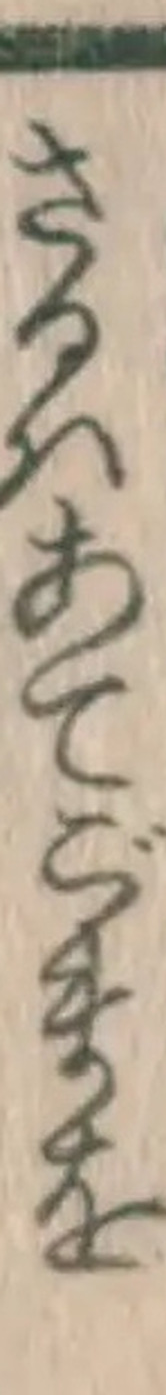さるはあてごまを
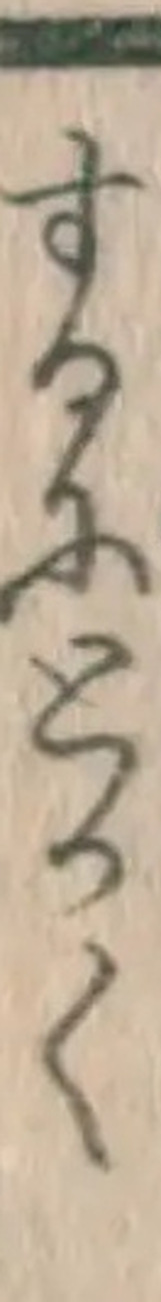するにとかく
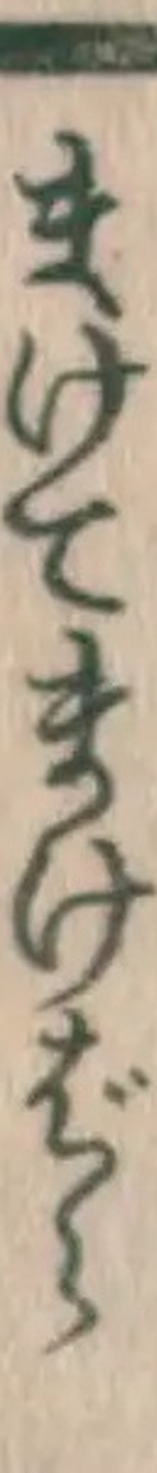まけてまけばら
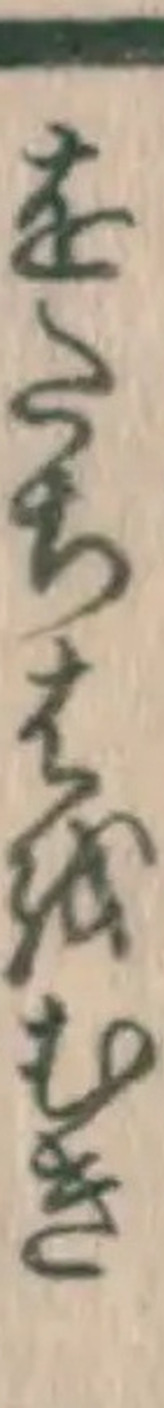をたちはをむき
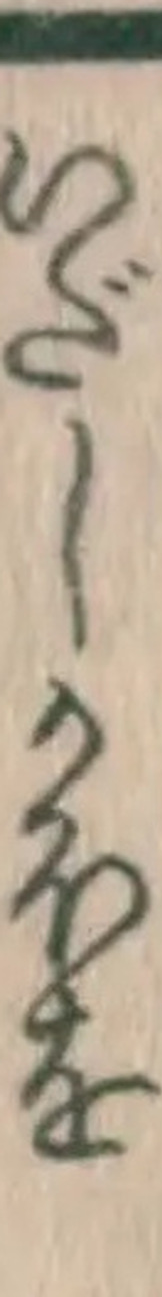いだしかほを
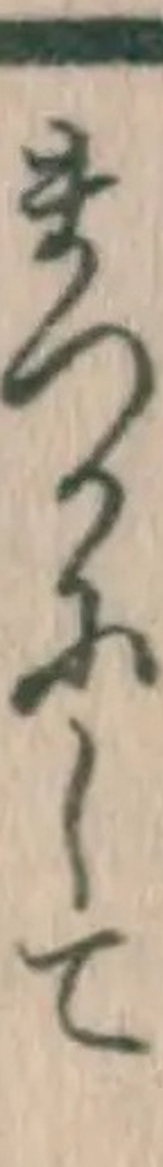まつかにして
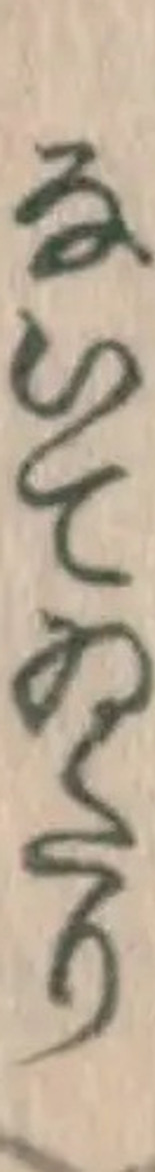ないてゐたり
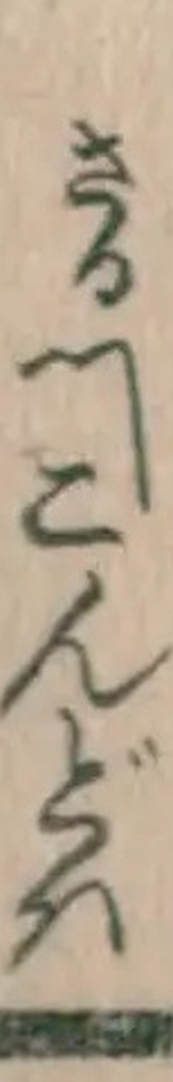さる〽こんどは
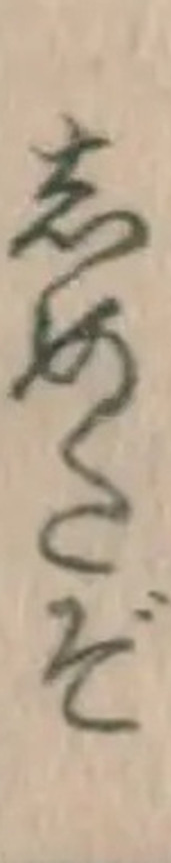しめたぞ
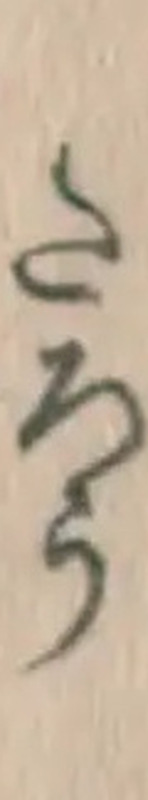たろう
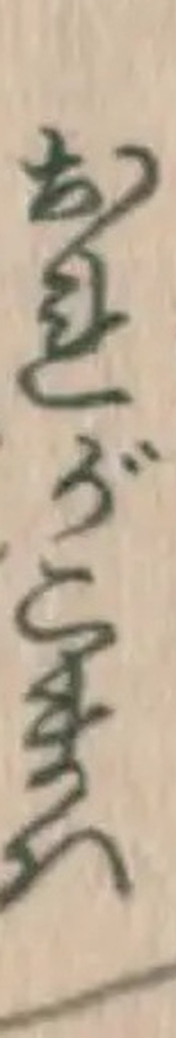おれがこまは
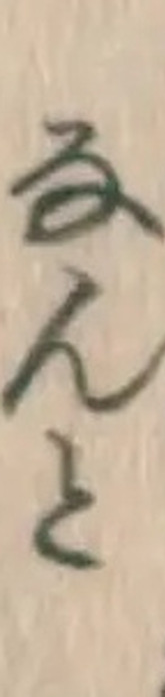なんと
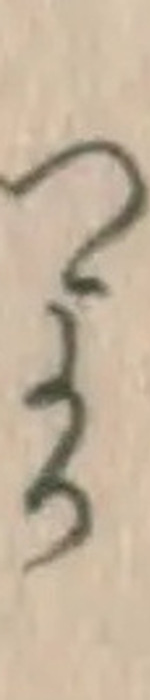つよか
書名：金太郎
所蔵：国立国会図書館 National Diet Library, JAPAN
